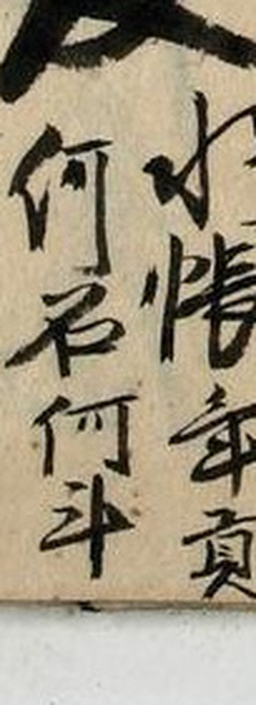何石何斗
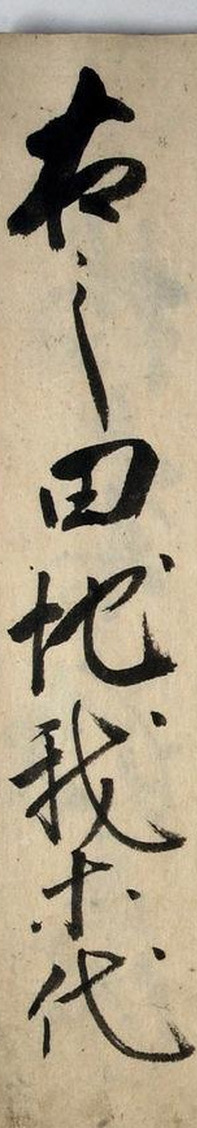右之田地我等代

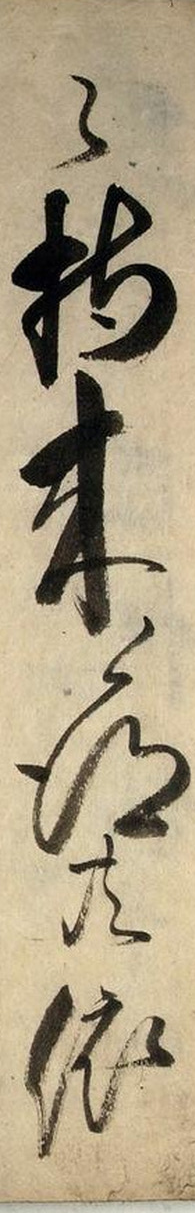々持来候得共依
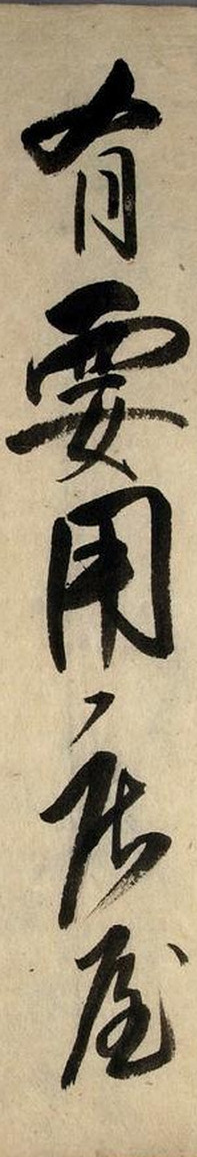有要用庄屋
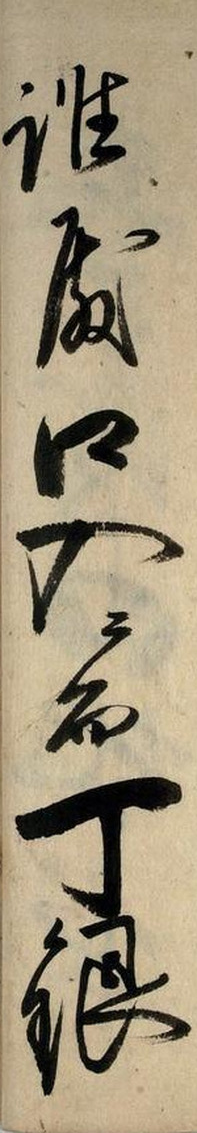誰殿口入に而丁銀
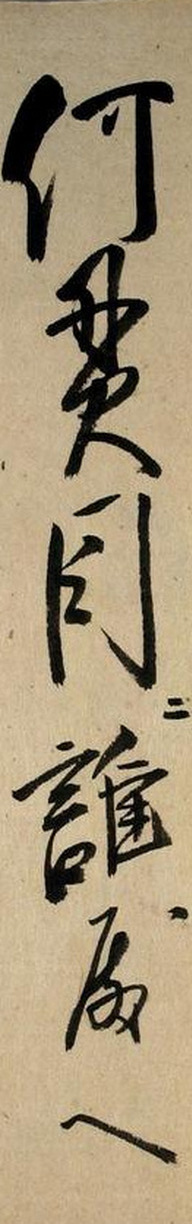何貫目に誰殿へ
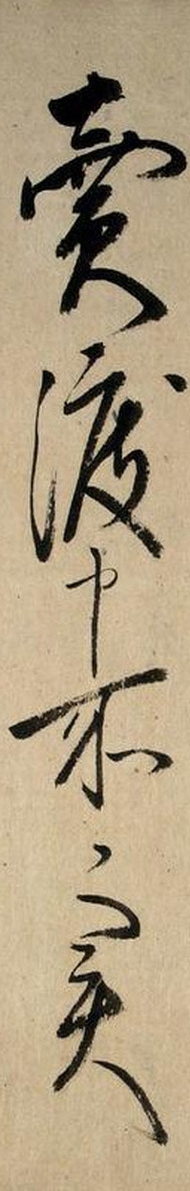売渡申所実
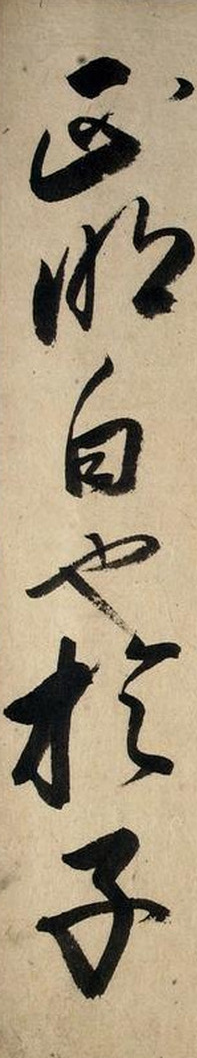正明白也於子

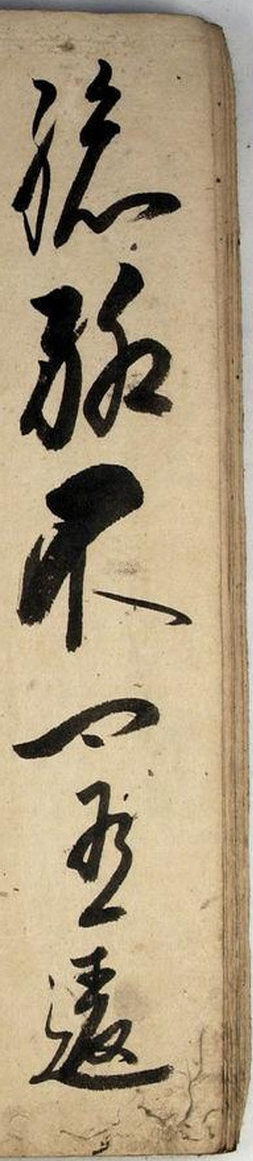孫敢不可有違
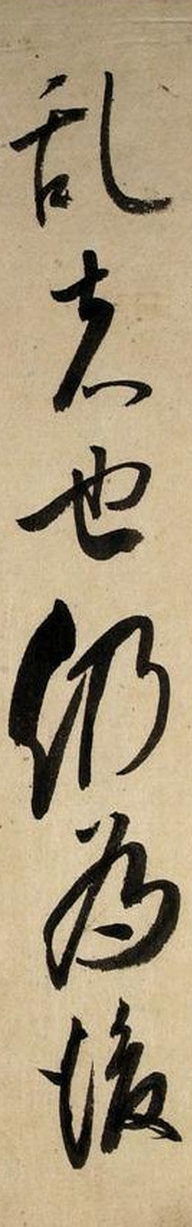乱者也仍為後
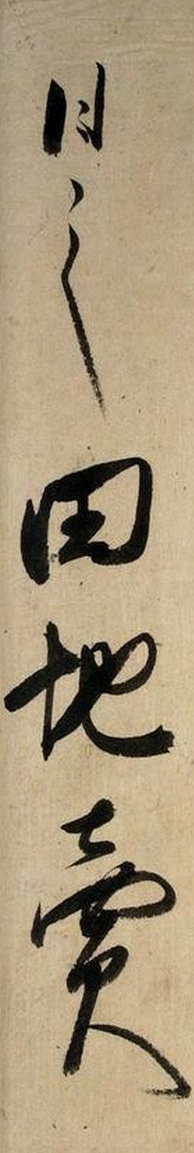日之田地売
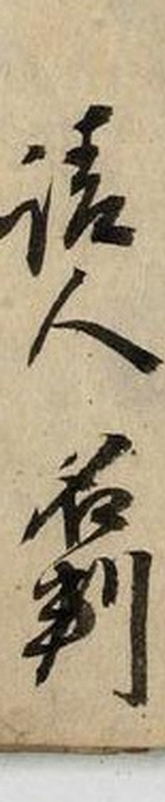請人名判
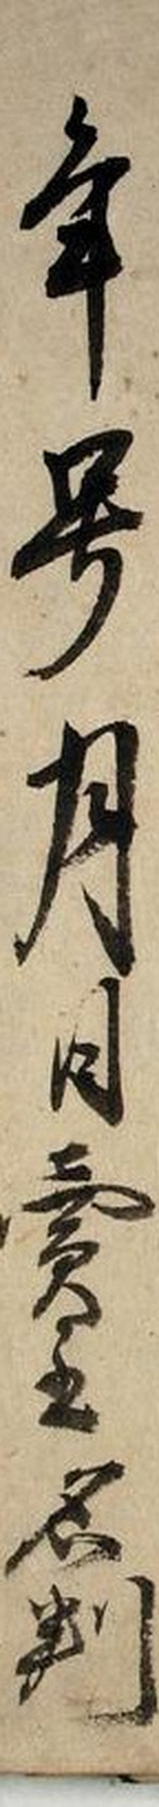年号月日売主名判

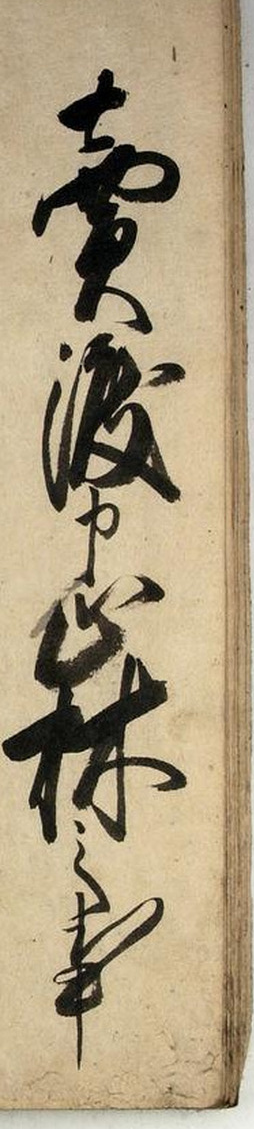売渡申山林之事
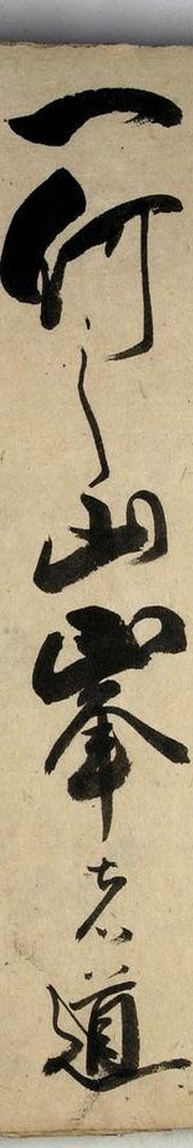一何之山峯は道
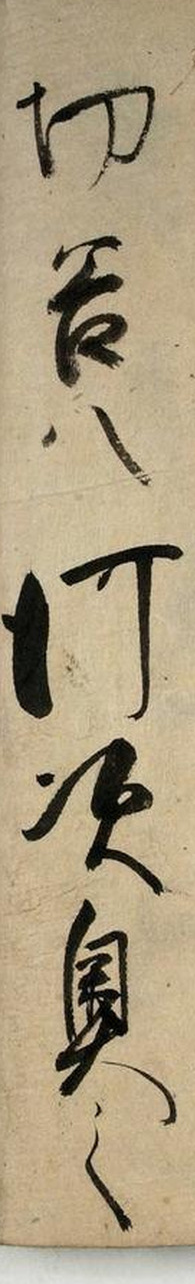切谷は何沢奥之
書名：御手本（手習、預リ申銀子之事、売渡申家屋敷事ほか）
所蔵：福井県文書館 Fukui Prefectural Archives
